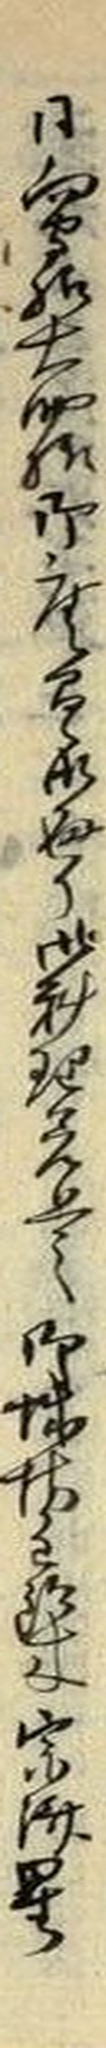日向守様大助様御座之間へ御通り御料理差上之御城坊主鈴木宗済星
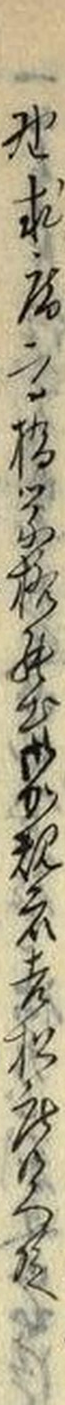野求庵高橋栄格罷出御加規衆吉松庄右衛門殿
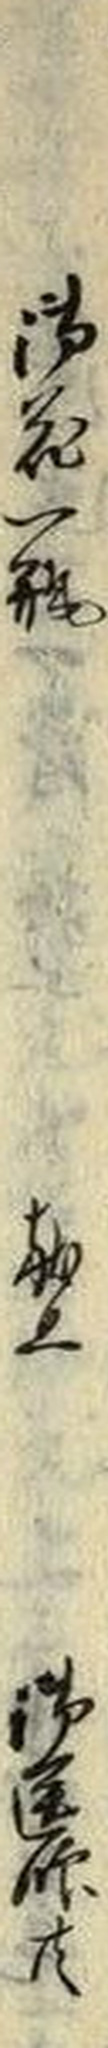御花一瓶献上御医師共
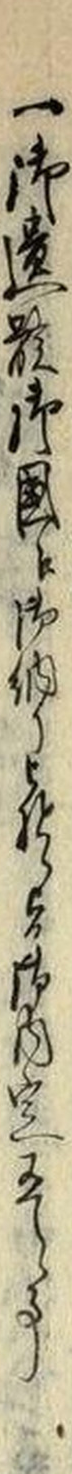一御遺骸御国江御納り被遊候旨御内定有之候事
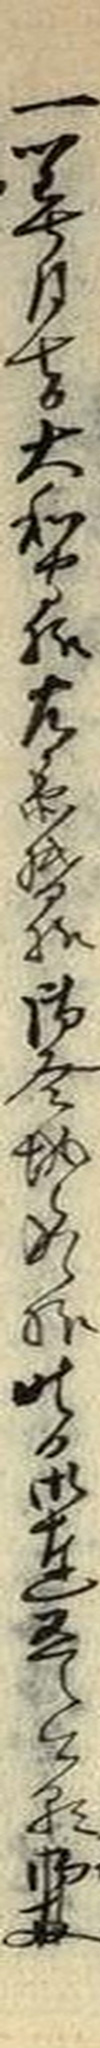一閏七月七日大和守様左兵衛督様御登城被成候様昨日御達有之今朝大和守様
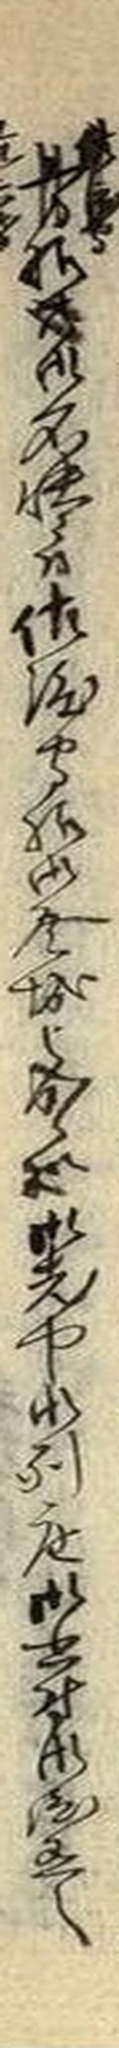左兵衛督様御不快ニ付佐渡守様御登城被成候処御老中御列座御書付御渡有之
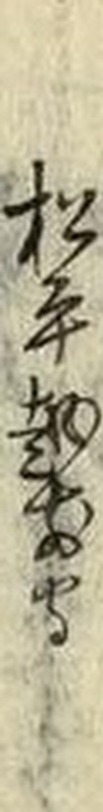松平越前守
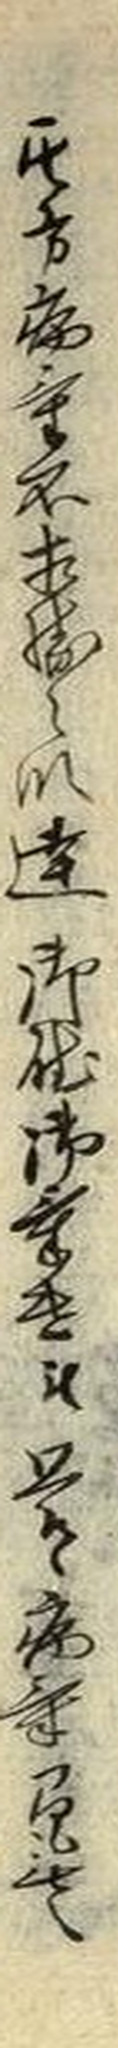其方病気不相勝候段達御聴御気遣被思召候病気間も無之
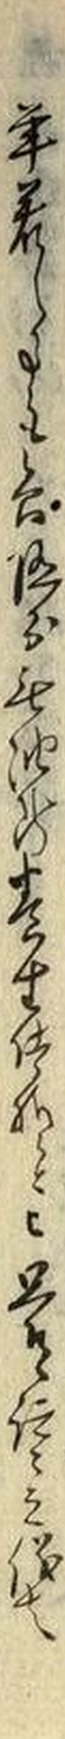年若之事ニも候間随分無油断養生仕候様ニと被思召候跡々之儀者
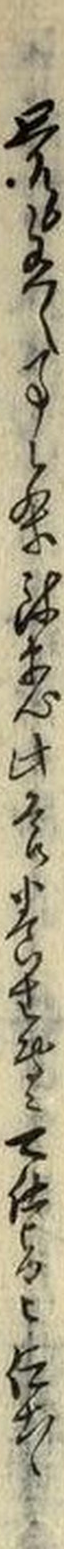思召も有之候事候条致安心此節養生専ニ可仕旨被仰出候
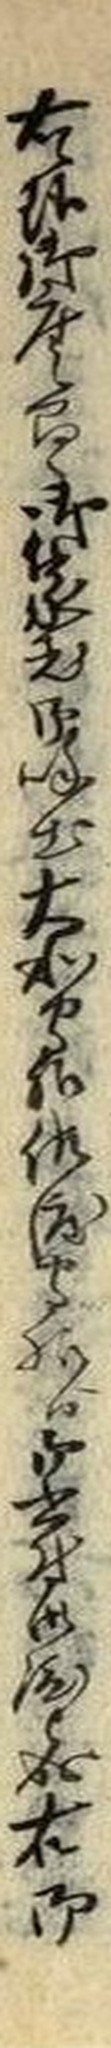右趣御座之間へ御家老御呼出大和守様佐渡守様ゟ御書付御渡被成右御
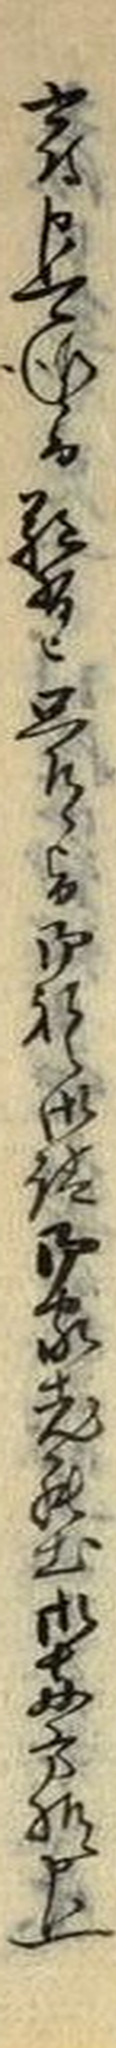書付申上候趣ニ而難有被思召候旨御礼之御請御家老罷出御両方様へ申上

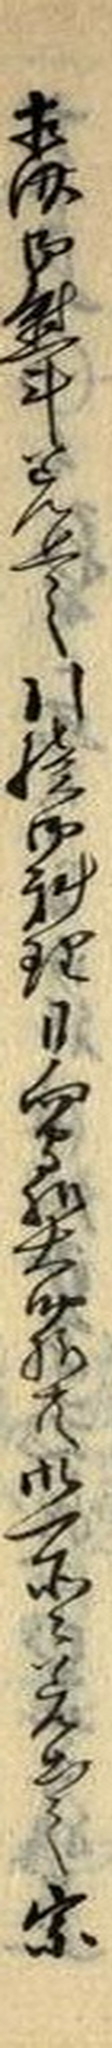相済御熨斗差上之引続御料理日向守様大助様共御一所ニ差出之宗
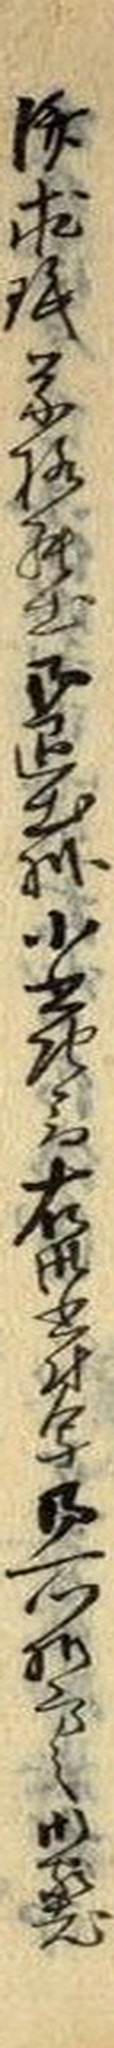済求珉栄格罷出御退出掛小書院ニ而右御書付写御一門様方之御家老
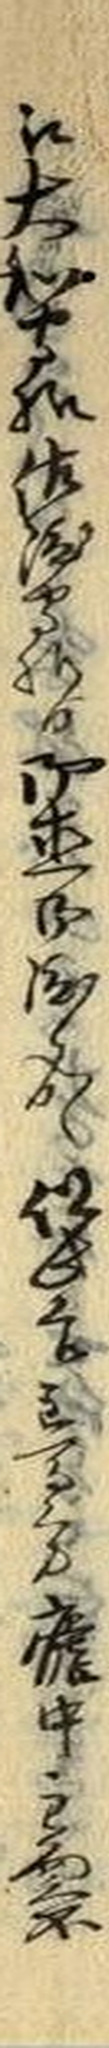江大和守様佐渡守様ゟ御直御渡被成候但此節主馬方瘧中主殿不
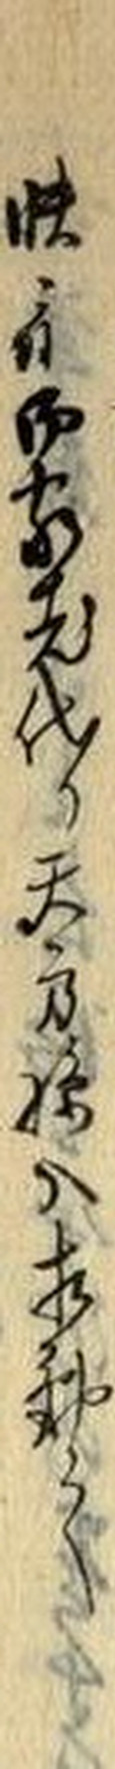快ニ付御家老代り天方孫八相勤之
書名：少傅日録抄（斉承付側向頭取日記、在府）
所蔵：福井県文書館 Fukui Prefectural Archives
